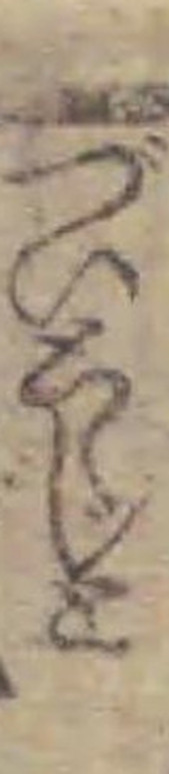づいとくじと
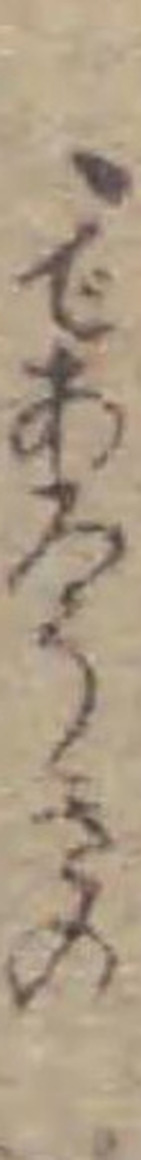であろうきの
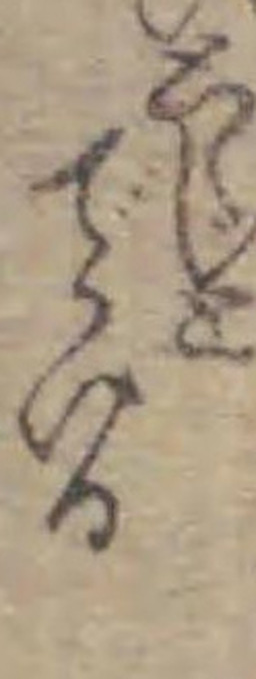でかける
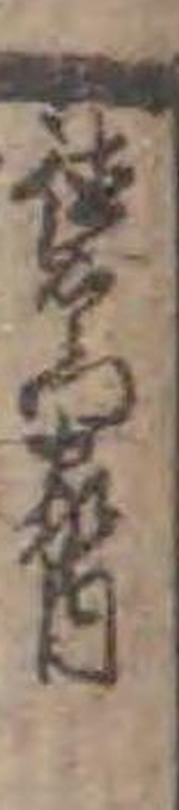徳右衛門家内
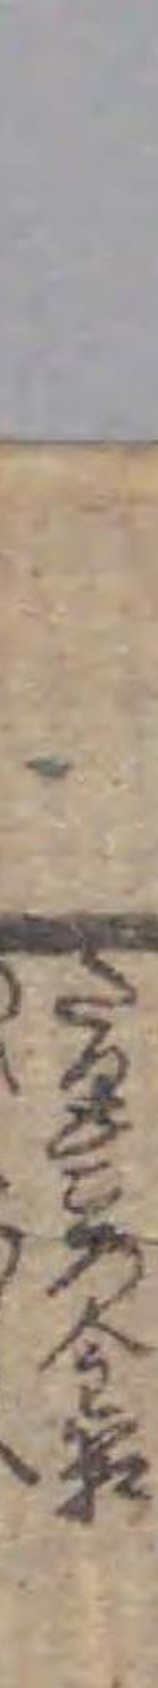たるところ金箱
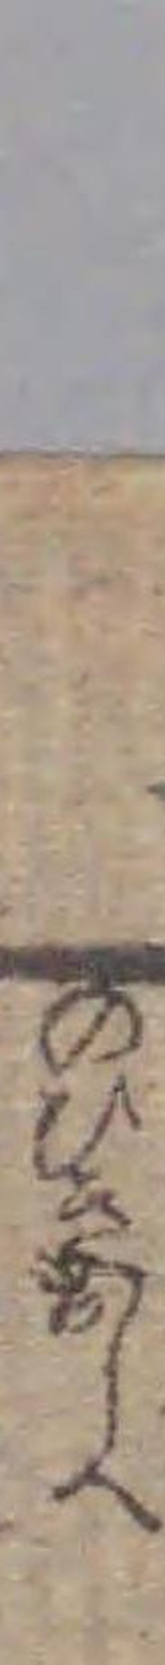のひき出しへ
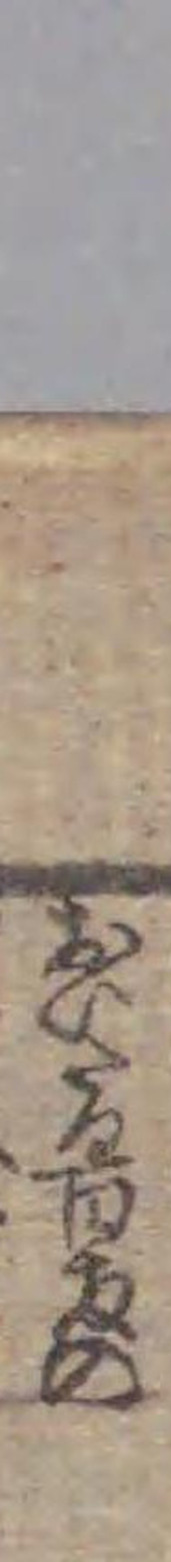おいたる百両の
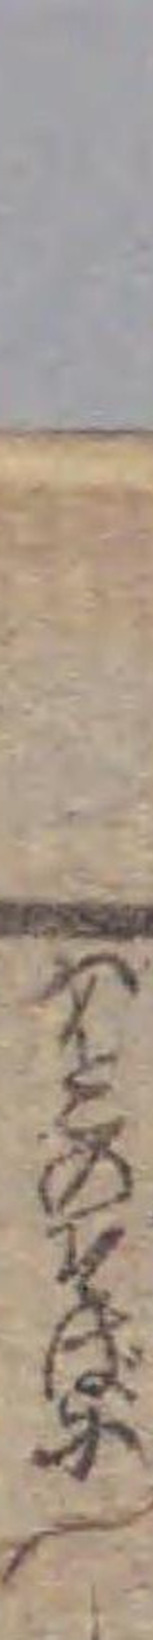ははこのそばに
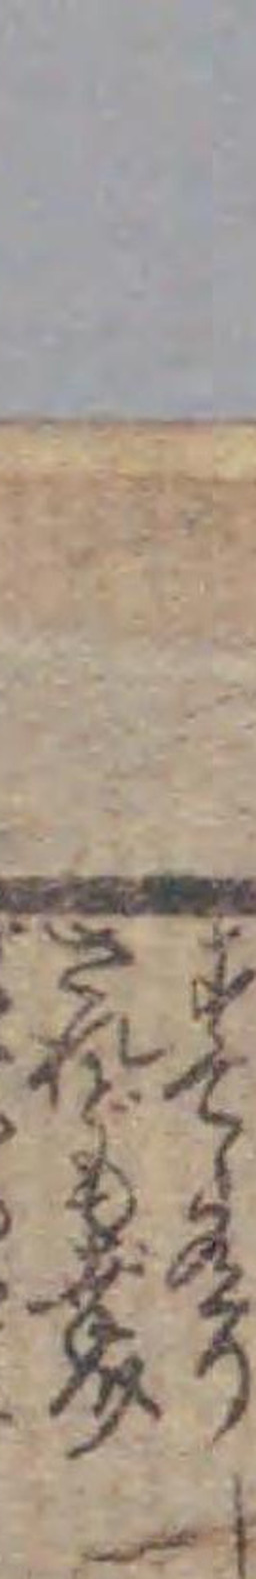されども幸介
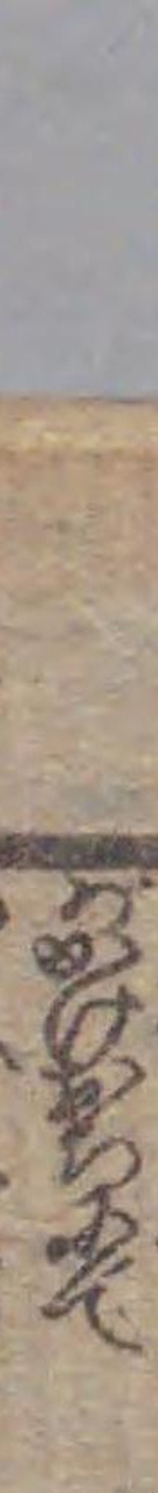がかけおちにて
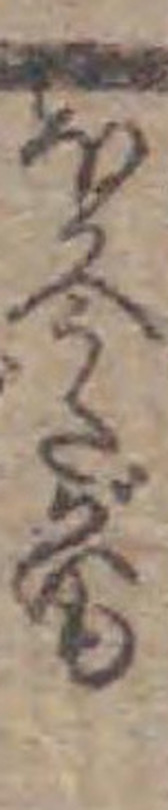ほかへうたがいも
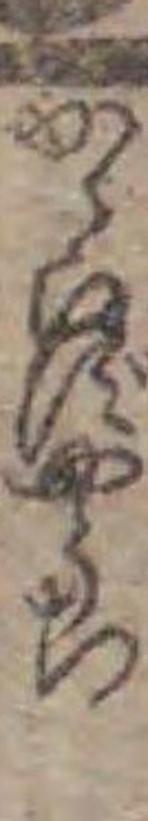かゝらずやうち
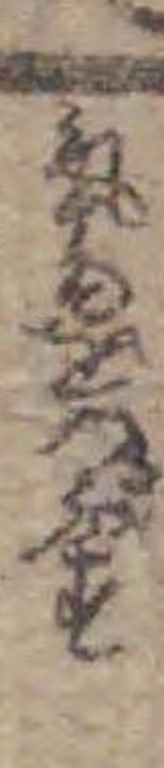きもをつぶす
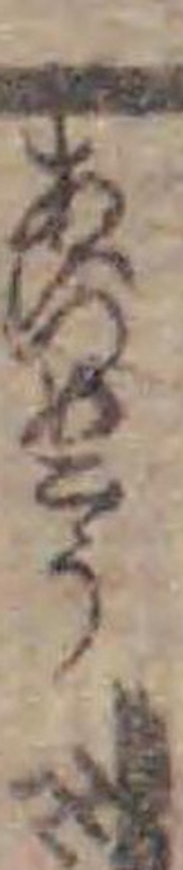あいつめこう
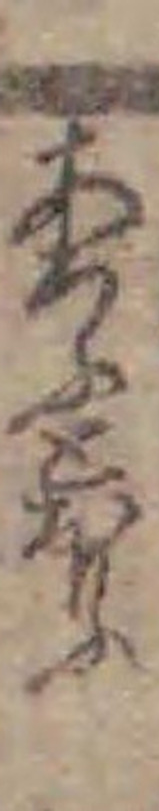あろふとおもふ

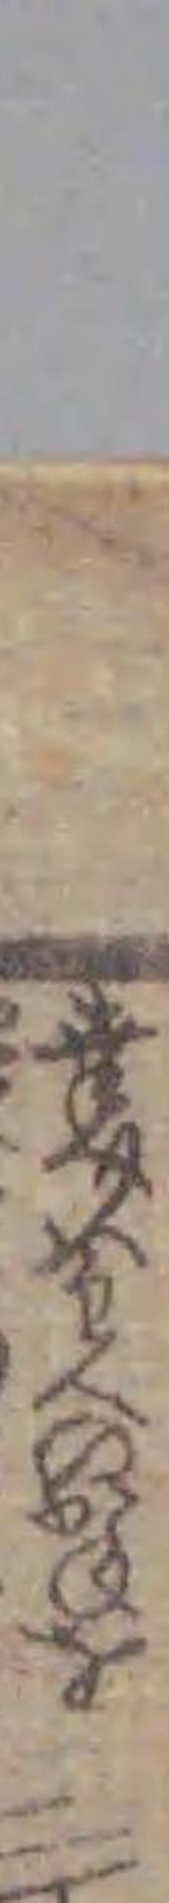幸介は主人のかねを
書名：通風伊勢物語 : 3巻
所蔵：国立国会図書館 National Diet Library, JAPAN
